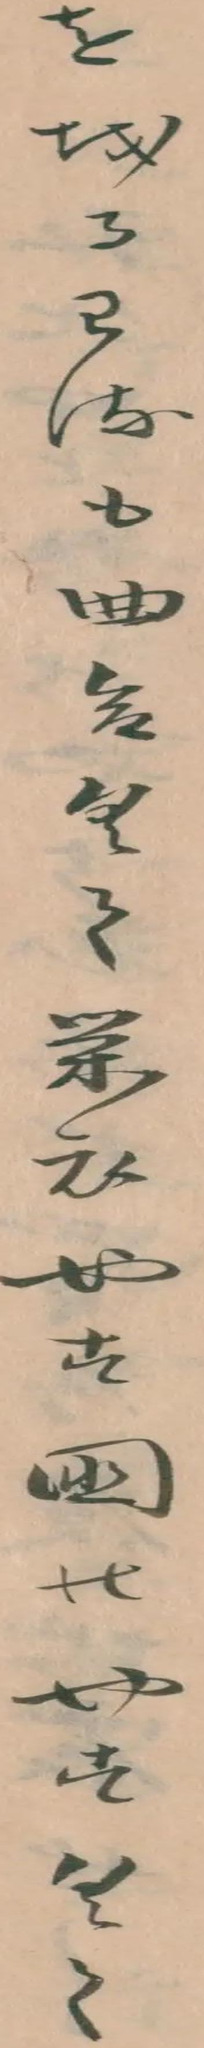ををるわるも曲くて栄えやす囦のやすくて
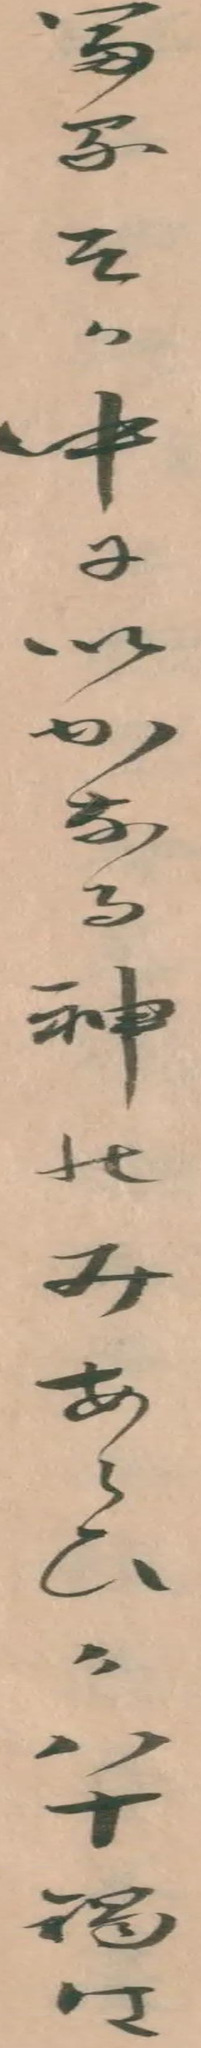冨るそか中にいかなる神のみあらひか八十禍津
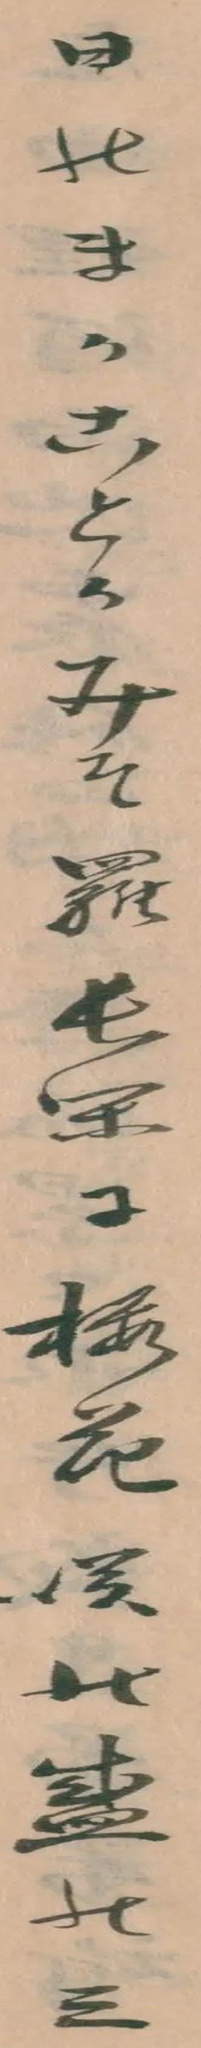日のまかことかみそら長閑に桜花咲の盛の三
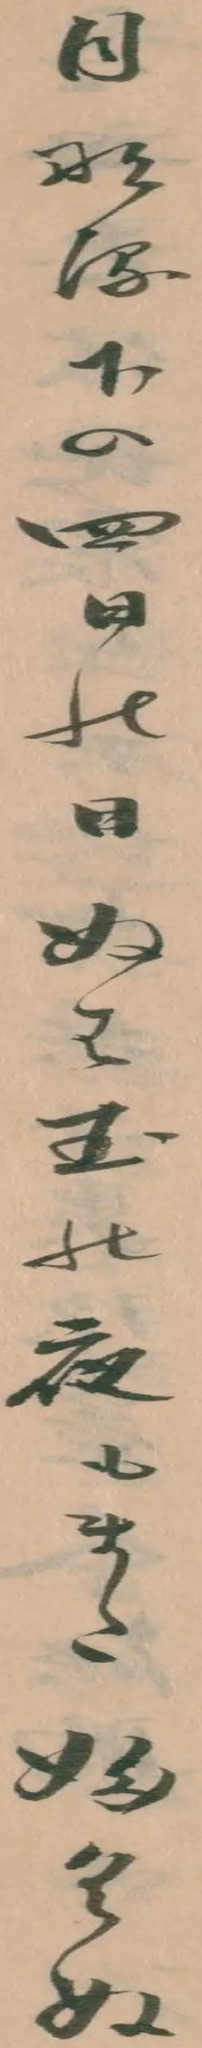月なる下の四日の日ぬは玉の夜もまたふくぬ
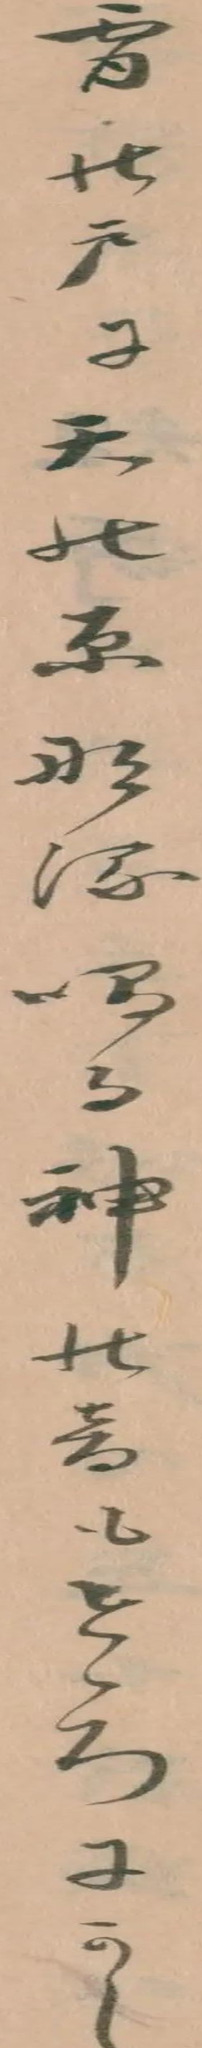宵の戸に天の原なる鳴る神の音もとゝろろにかし
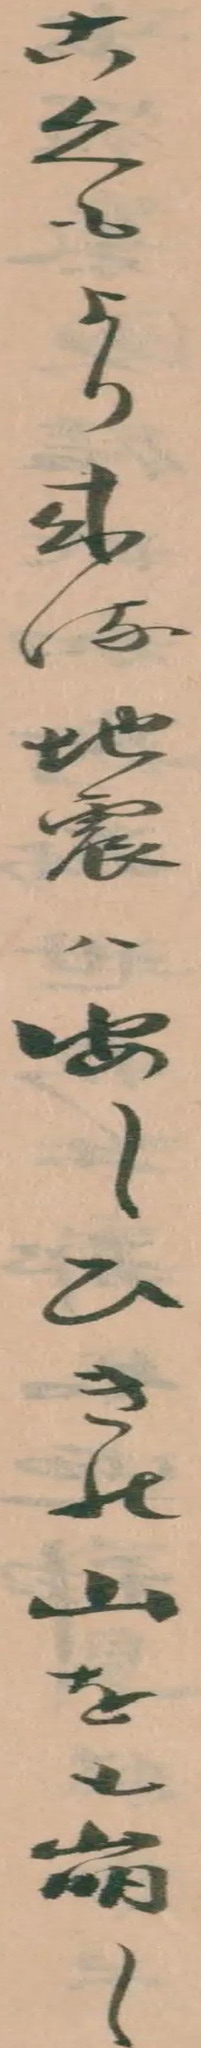こくもより来る地震はあしひきの山をも崩し
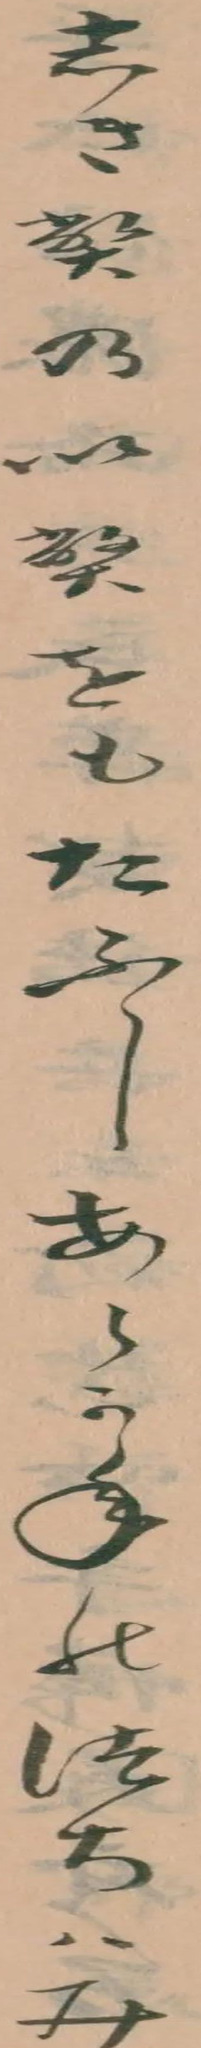しき(た)へのいへをもたふしあらかねのつちはみ
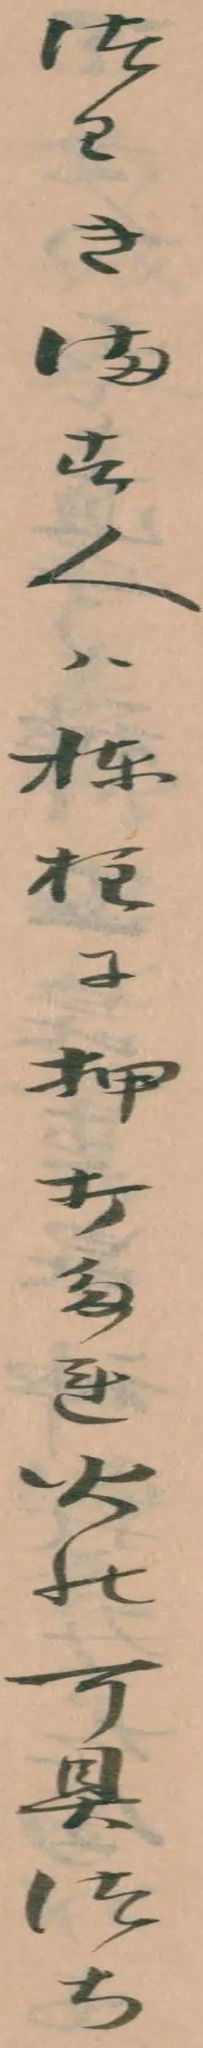つわきます人は棟柱に押打たれ火の可？具つち
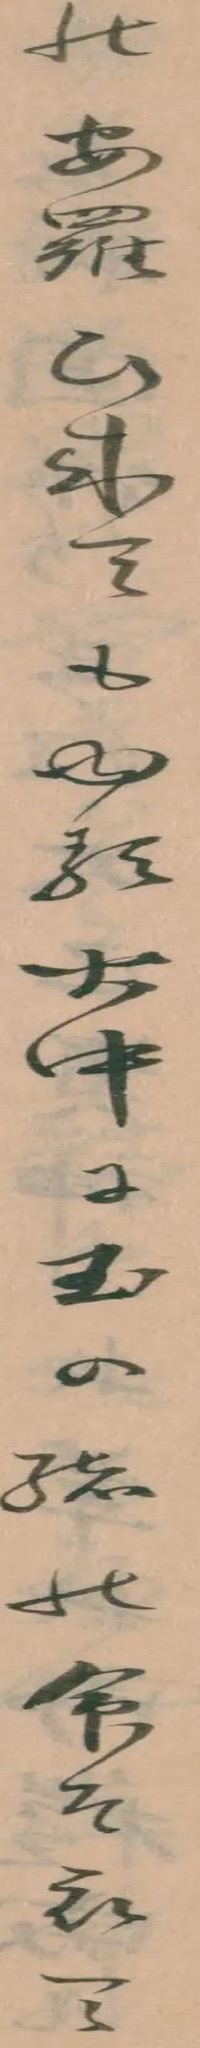のあらひ来てもゆる火中に玉の緒の命そえて
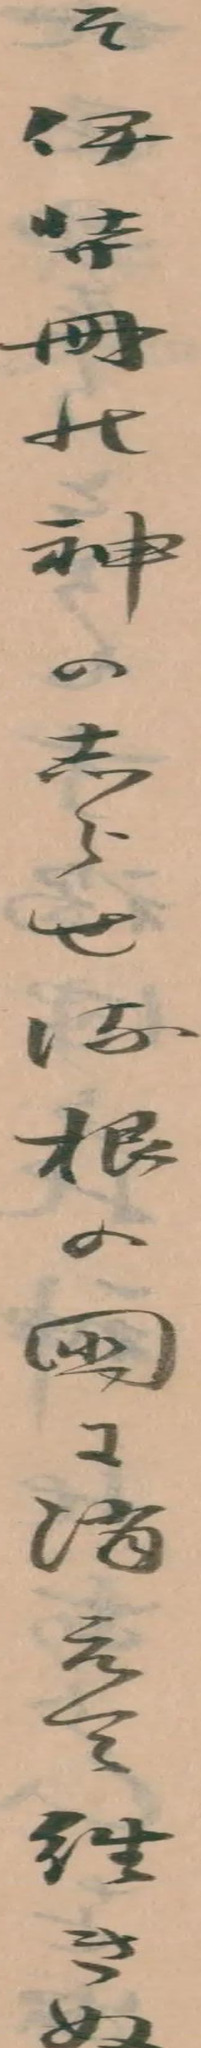そ伊弉冉の神のしらせる根の国に消えて往きぬ
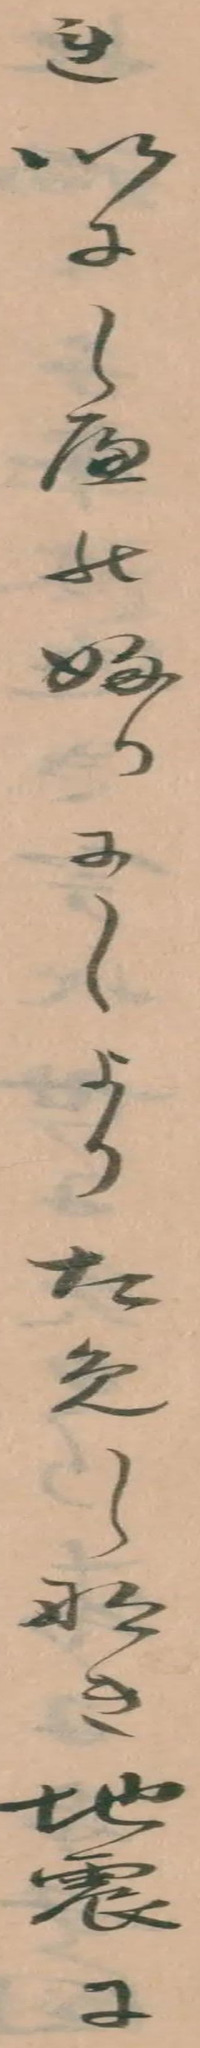れいにしへのふりにしよりためしなき地震に
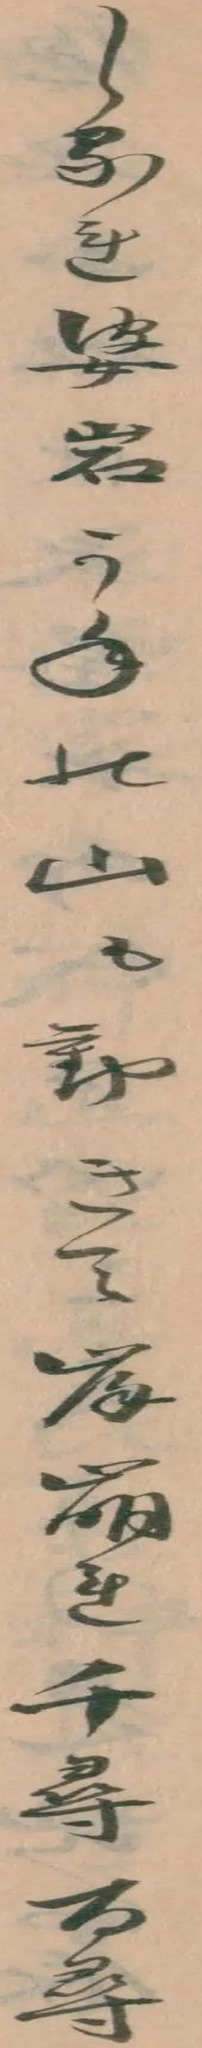しるれば岩かねの山も動きて崖崩れ千尋百尋
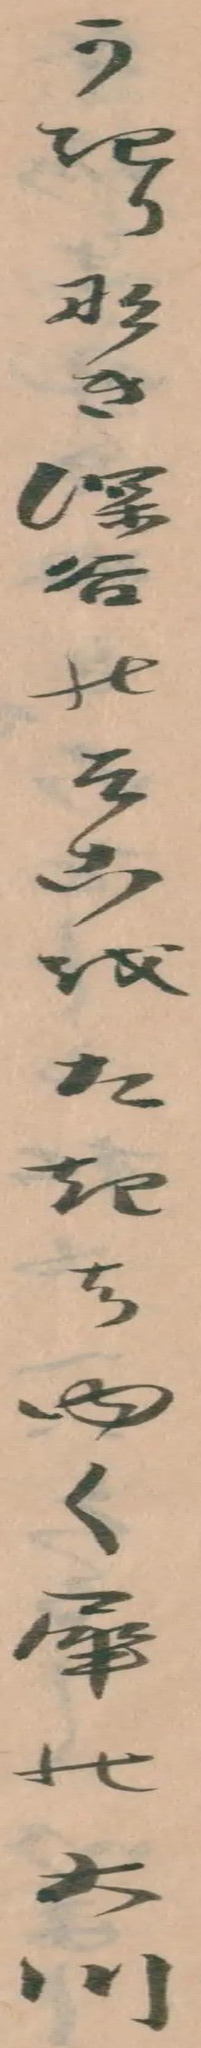かきりなき深谷のそこをたきちゆく犀の大川
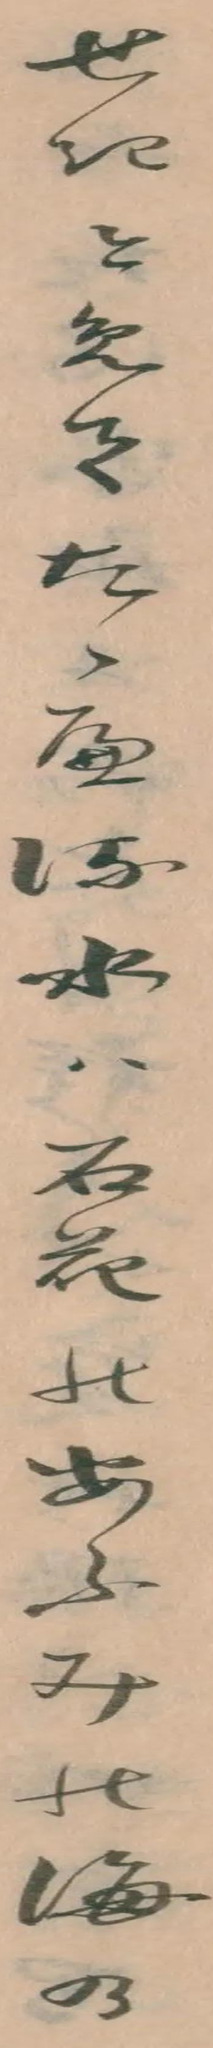せきとめてたゝへる水は石花のあふみの海の
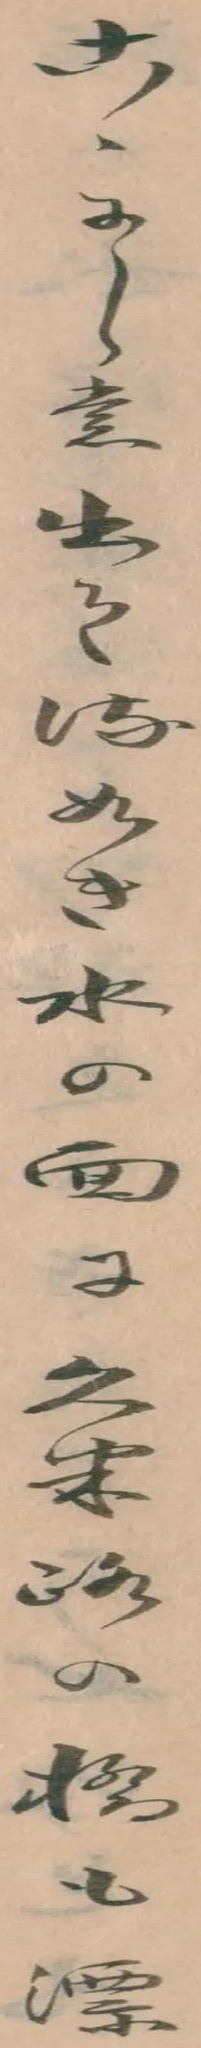こゝにしも出てる如き水の面に久米路の橋も漂
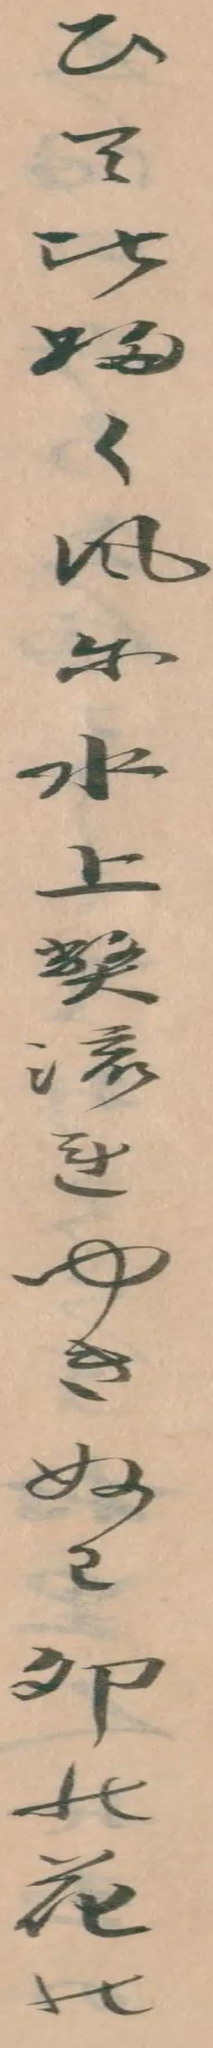ひて比ふく風に水上へ流れゆきぬわ卯の花の
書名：地災撮要. 巻5-6(地震之部)
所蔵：国立国会図書館 National Diet Library, JAPAN
